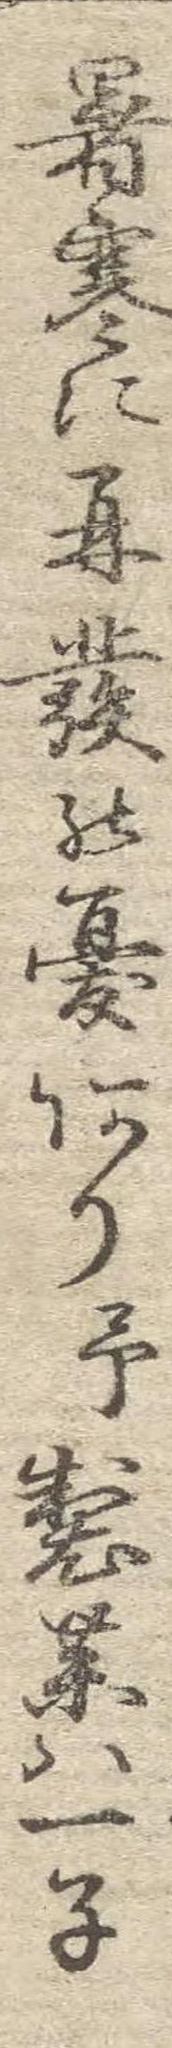暑寒に再発の憂あり予製薬は一子
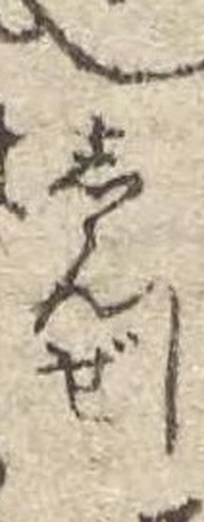しんぜ
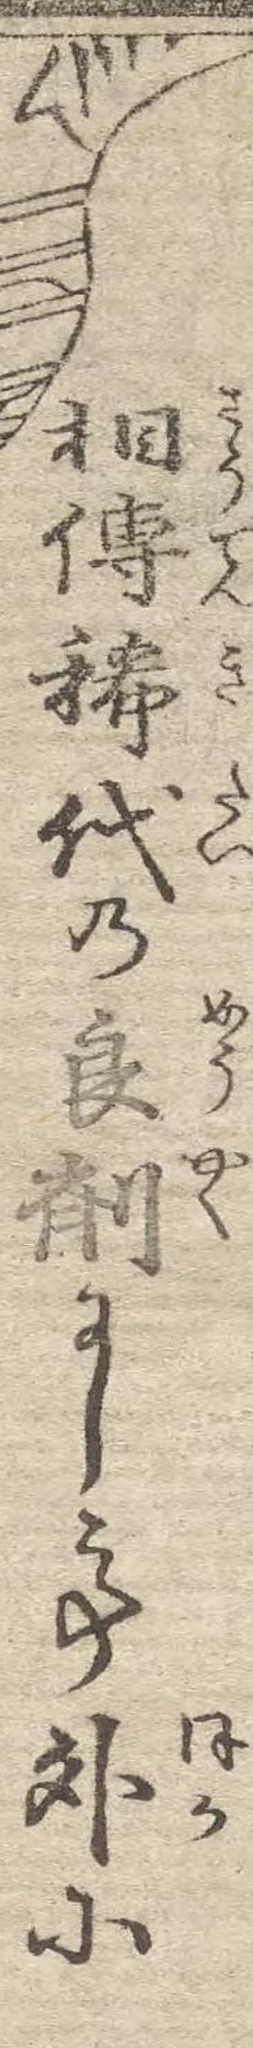相伝稀代の良剤にして外に
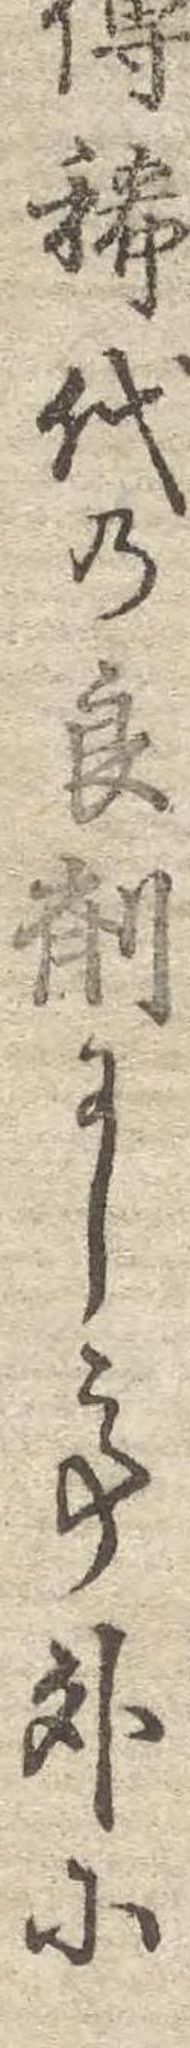相伝稀代の良剤にして外に
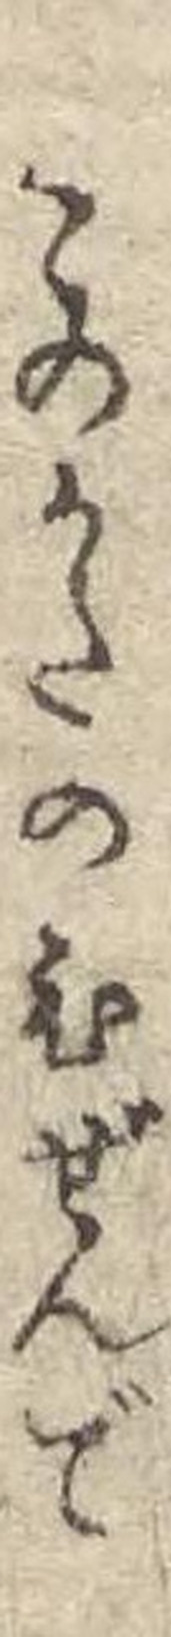このかたのひぜんで
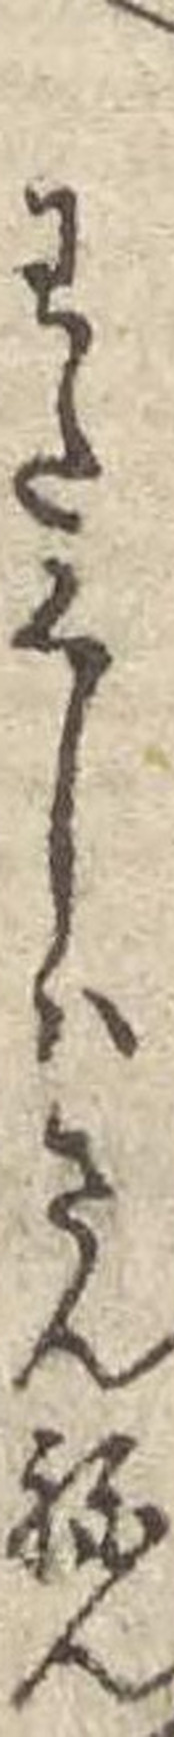わたくしはさんねん
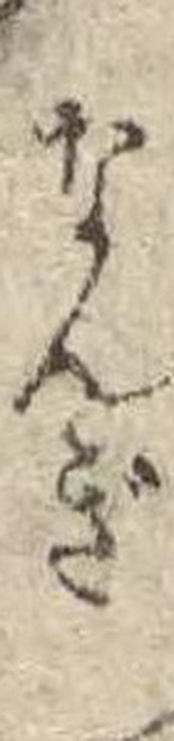なんぎ
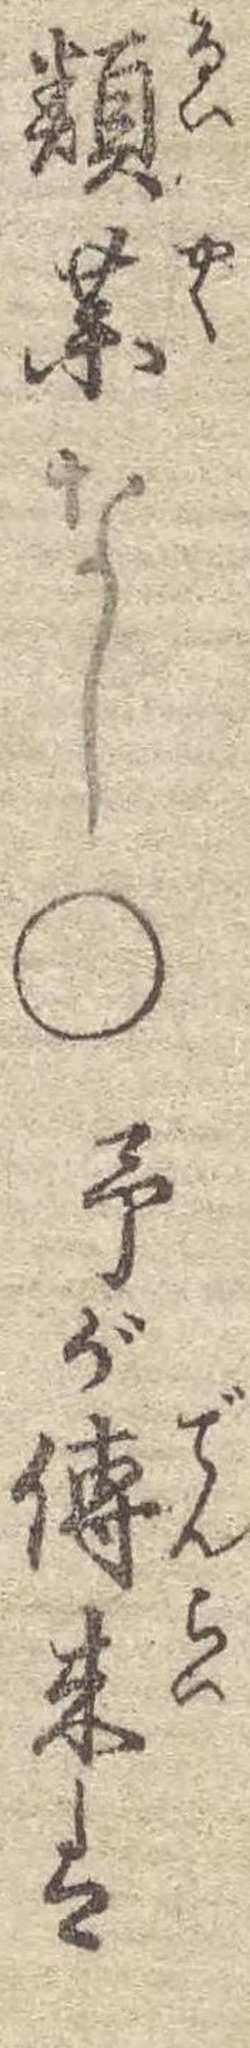類薬なし◯予が伝来は
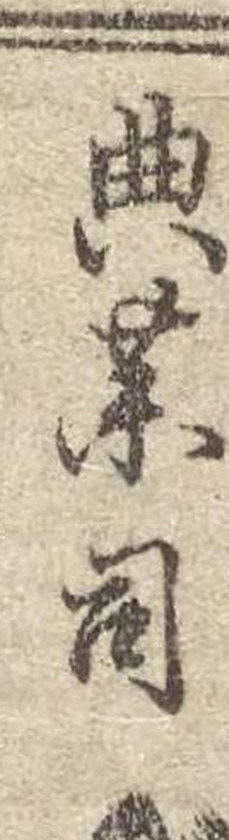典薬司
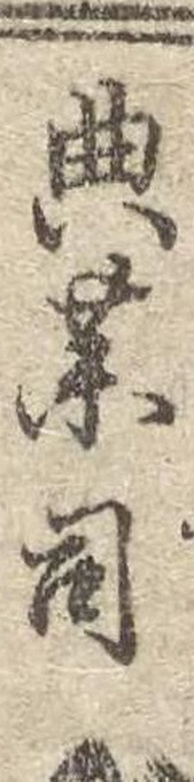典薬司
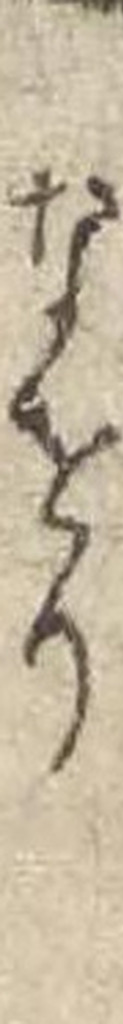なをり
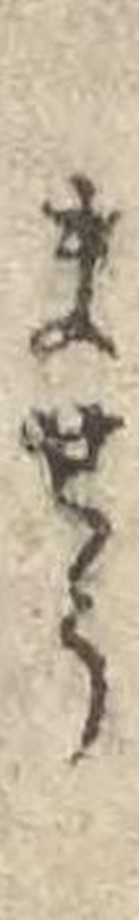ませう
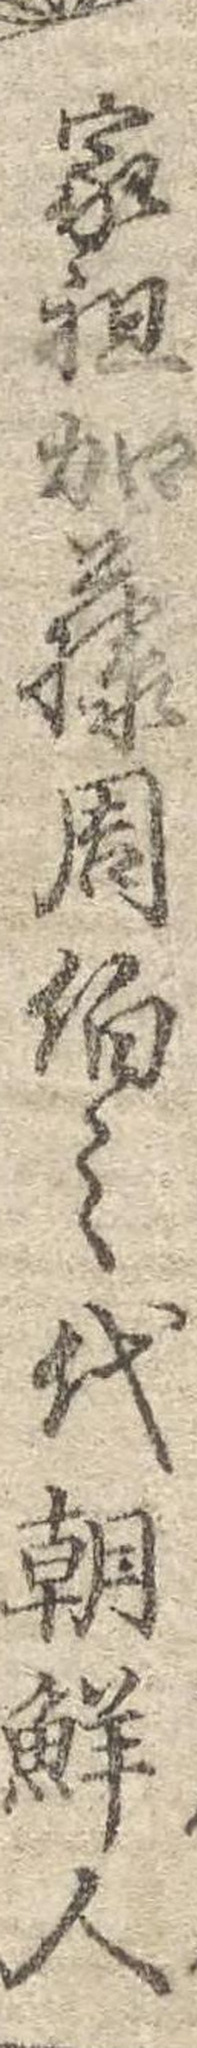家祖加藤周伯之代朝鮮人
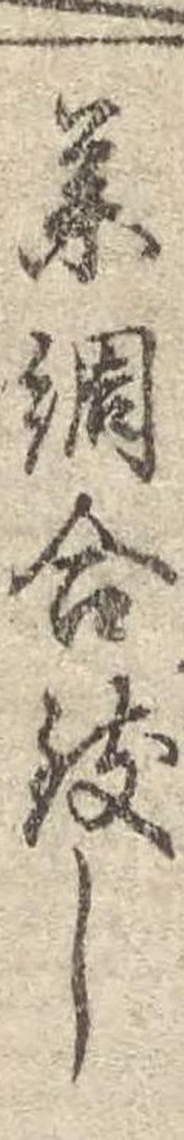薬調合致し
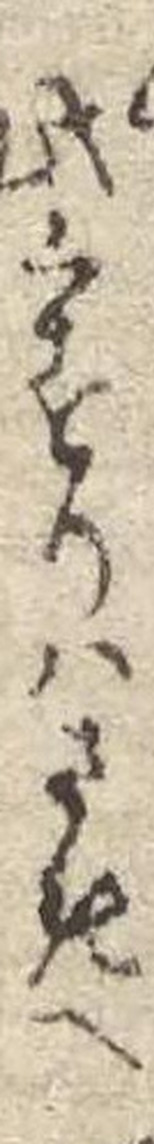此くすりはさきへ
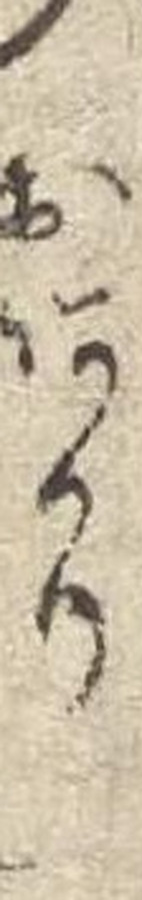おあかり
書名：浪華薬種問屋能書張交帖. 一
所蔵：国立国会図書館 National Diet Library, JAPAN
